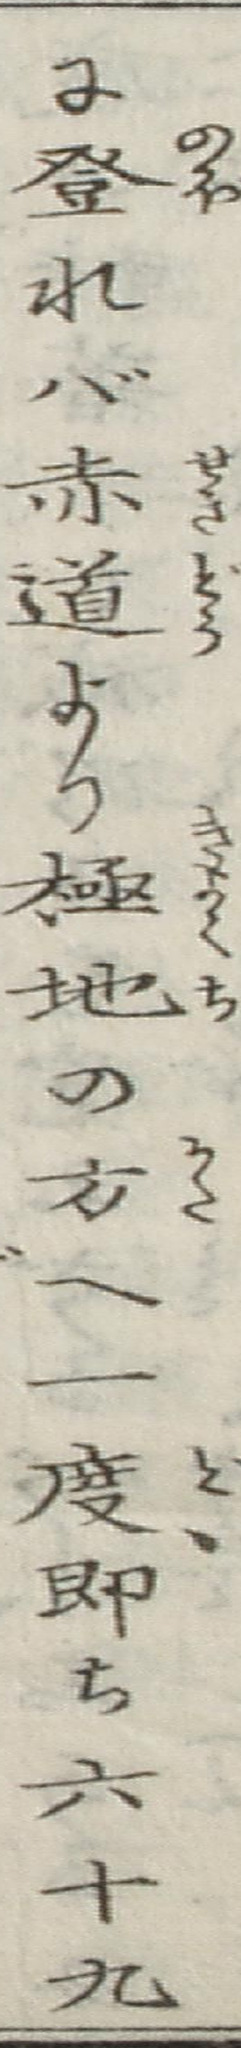に登れば赤道より極地の方へ一度、即ち六十九
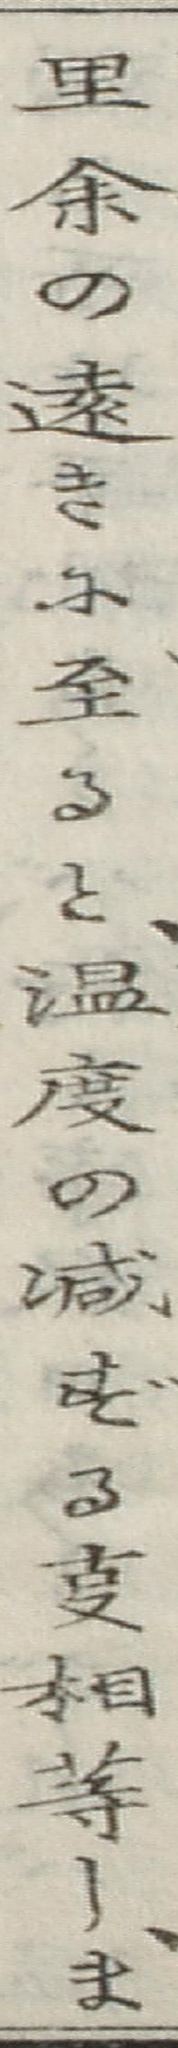里余の遠きに至ると、温度の減ずる事相等し、ま
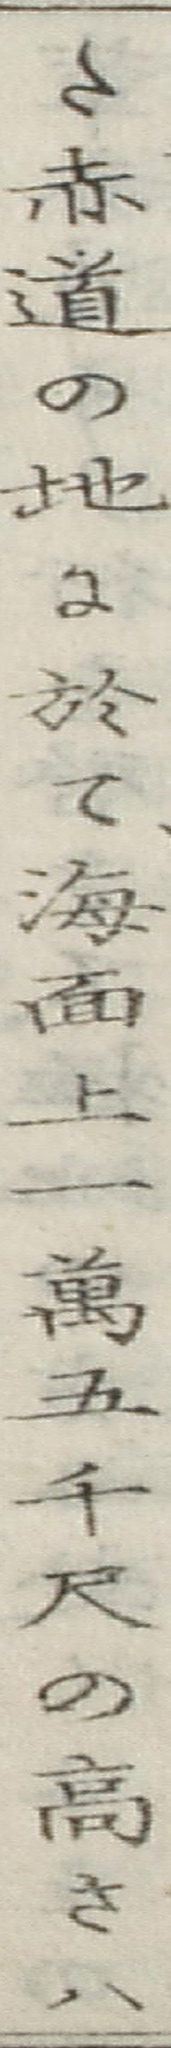た赤道の地に於て、海面上一万五千尺の高さは、
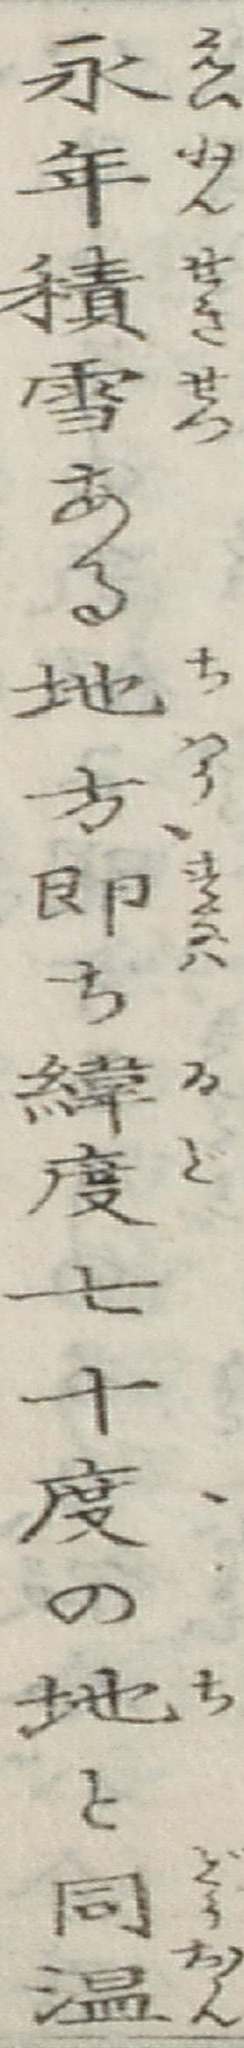永年積雪ある地方、即ち緯度七十度の地と同温
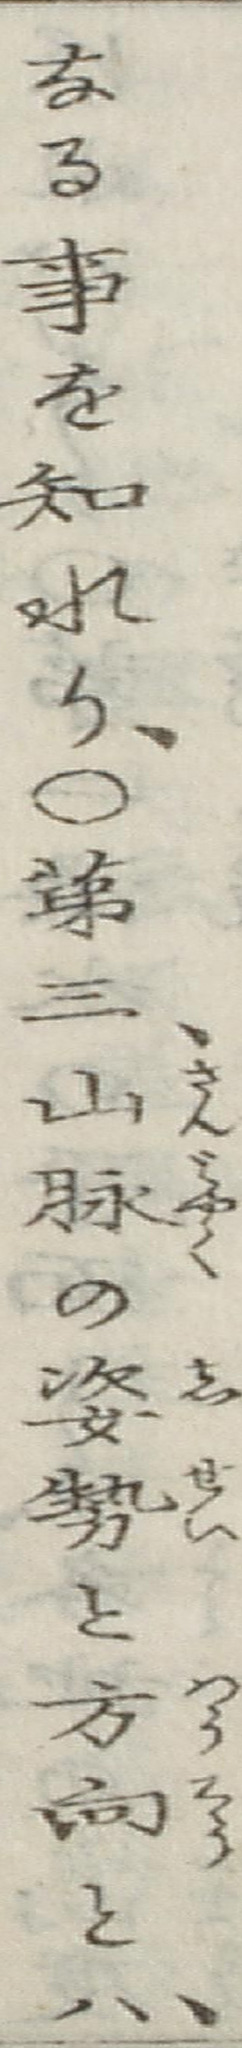なる事を知れり、○第三、山脈の姿勢と方向とは、
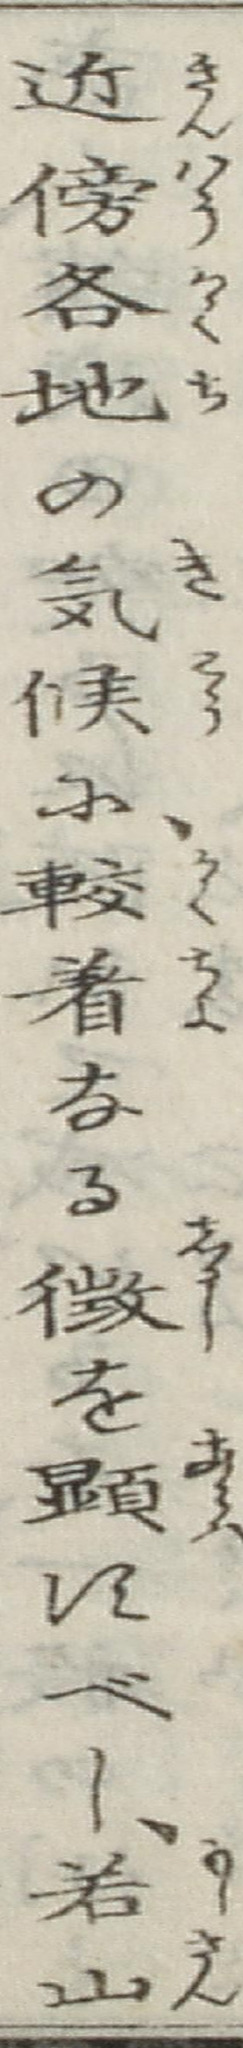近傍各地の気候に、較著なる徴を顕すべし、若山
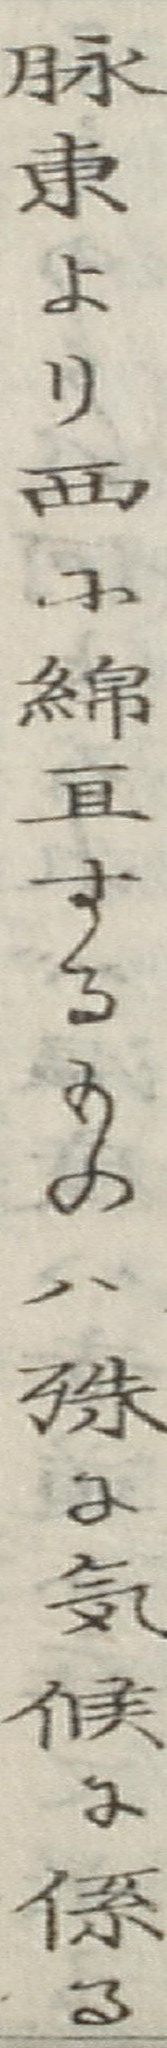脈東より西に綿亘するものは、殊に気候に係る
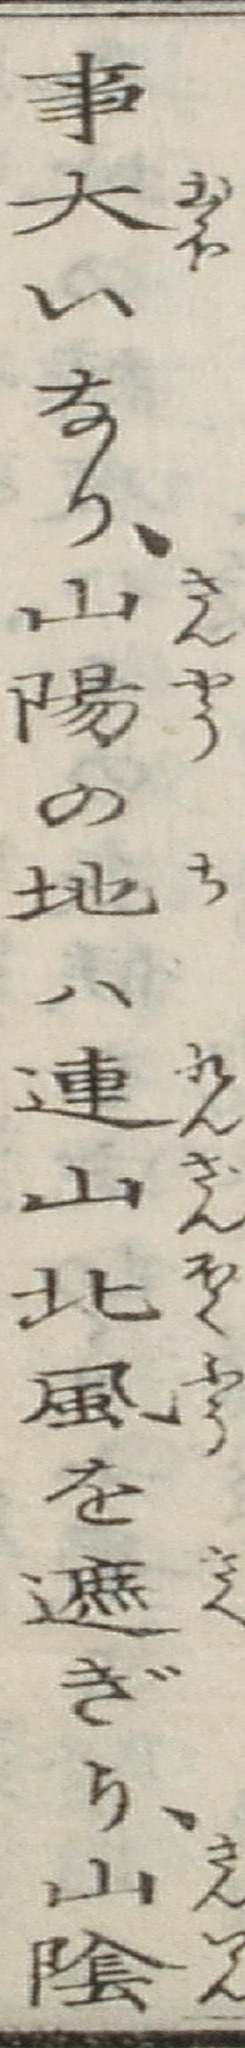事大いなり、山陽の地は連山北風を遮ぎり、山陰
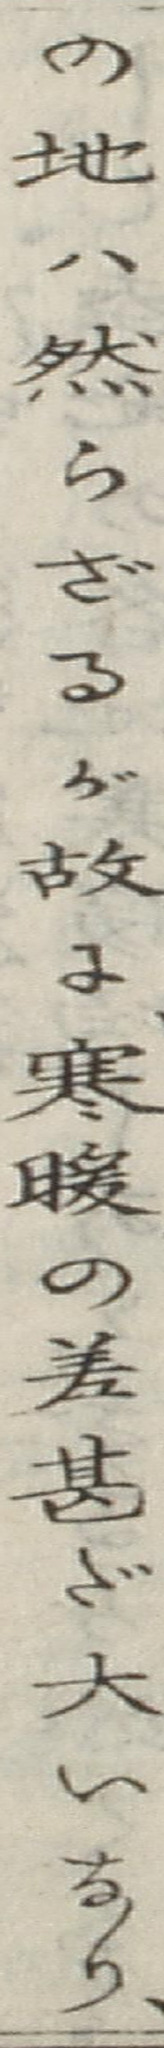の地は然らざるが故に、寒暖の差甚大いなり、
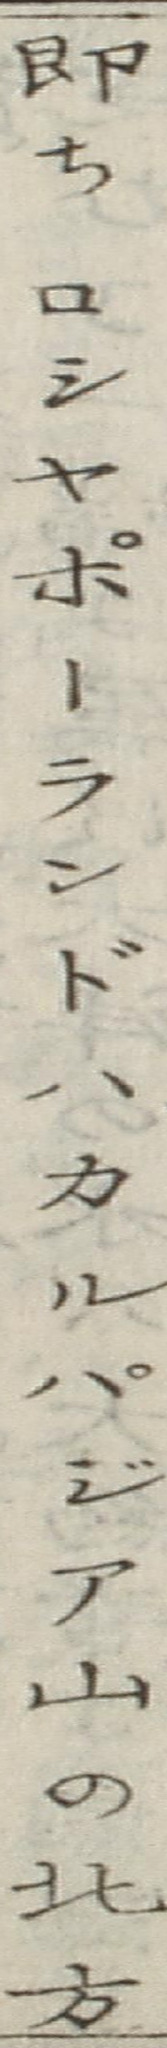即ちロシヤポーランドは、カルパジア山の北方
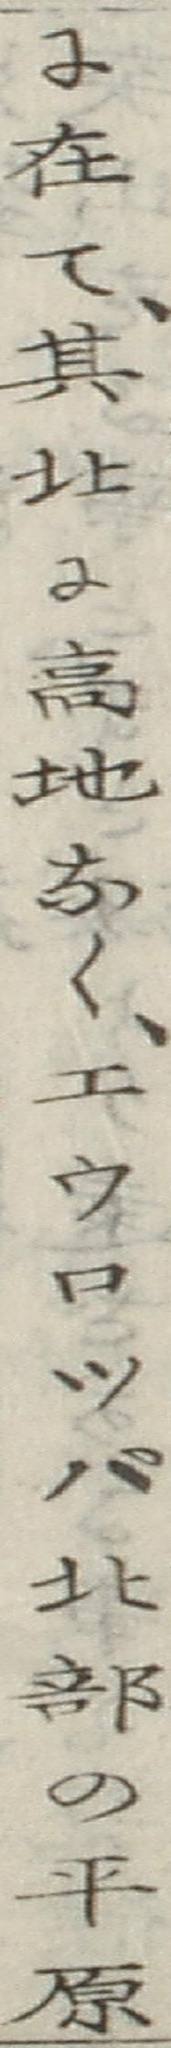に在て、其北に高地なく、エウロツパ北部の平原
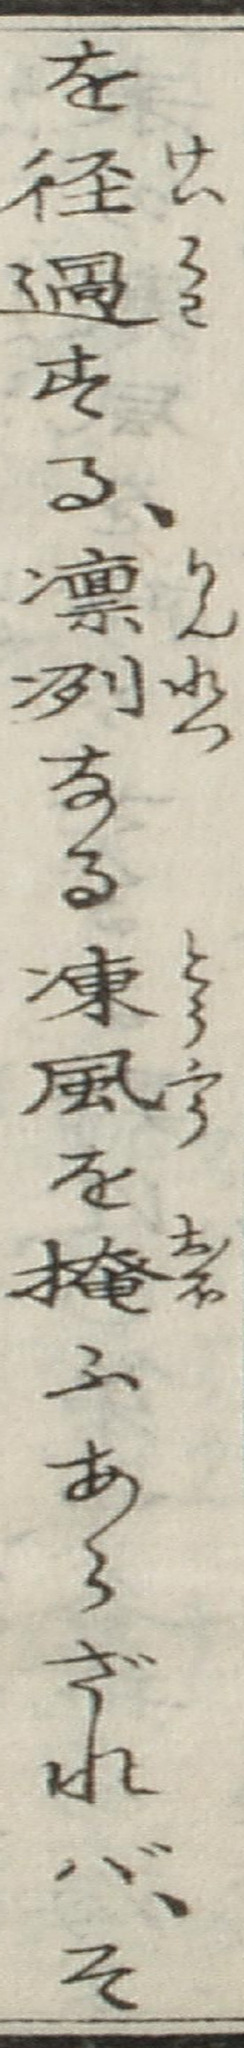を経過する、凛冽なる凍風を掩ふあらざれば、そ
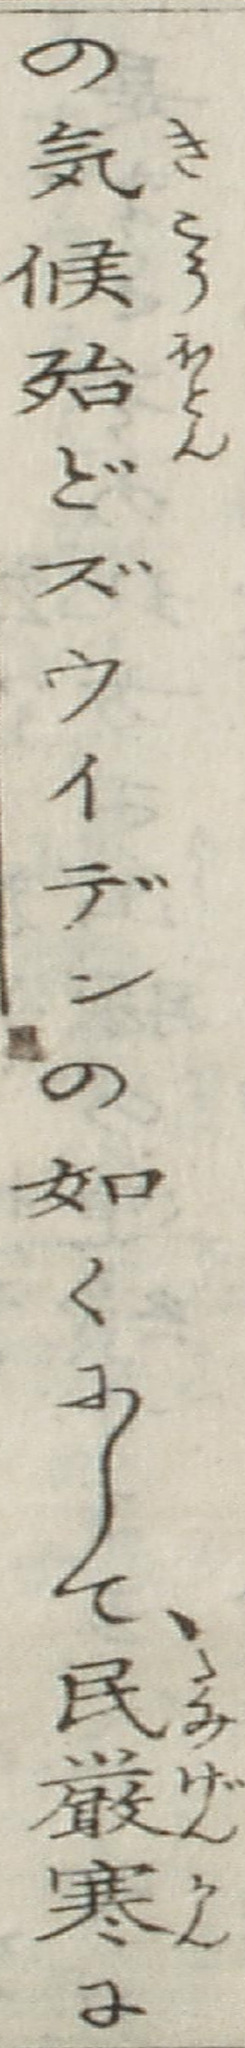の気候殆どズウイデンの如くにして、民厳寒に
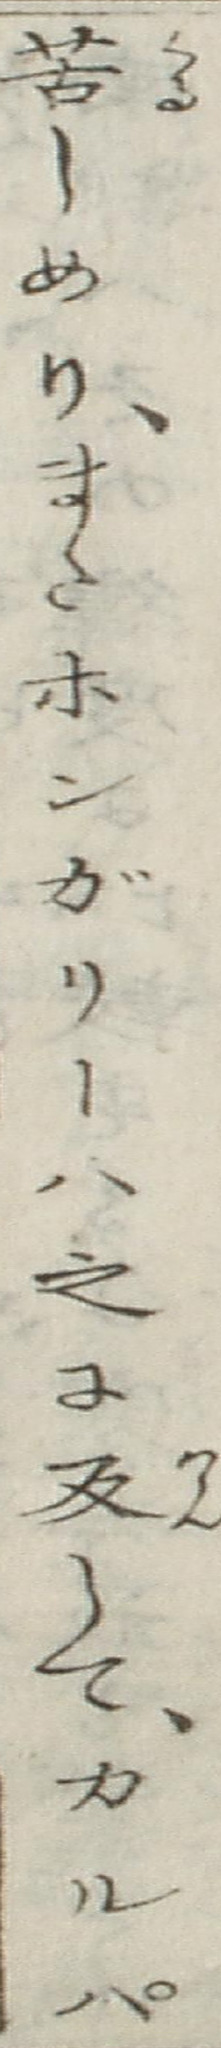苦しめり、またホンガリーは之に反して、カルパ
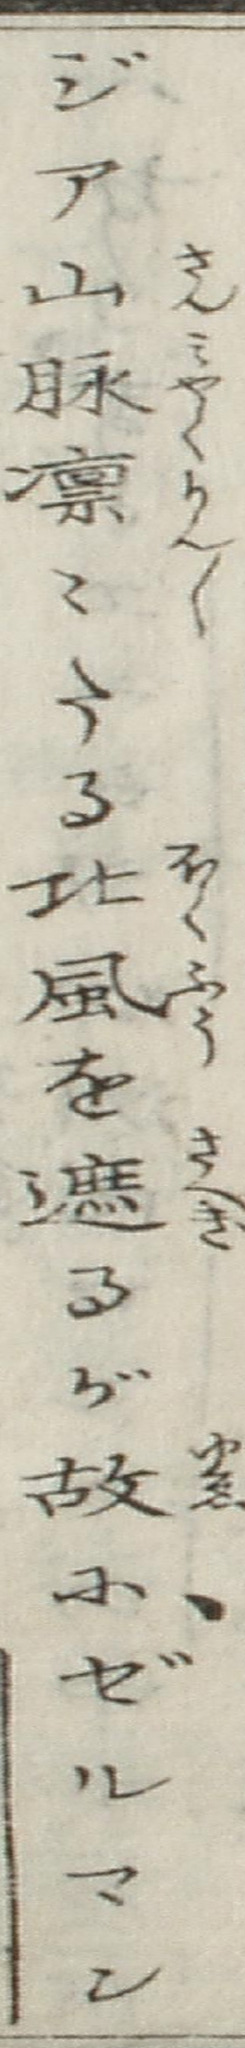ジア山脈凛〻たる北風を遮るが故に、ゼルマン
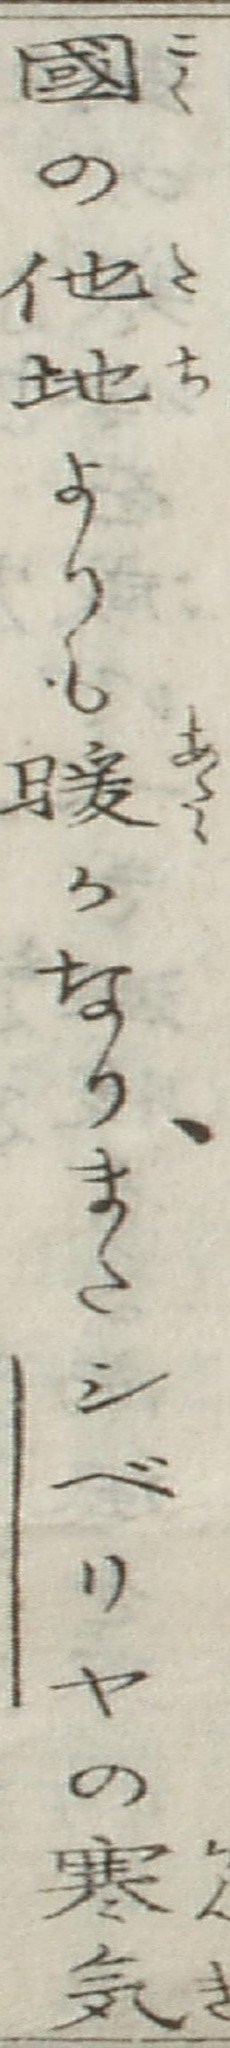国の他地よりも暖かなり、またシベリヤの寒気
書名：訓蒙　天然地理學　下
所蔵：東京大学地震研究所図書室 Earthquake Research Institute Library, The University of Tokyo, JAPAN
